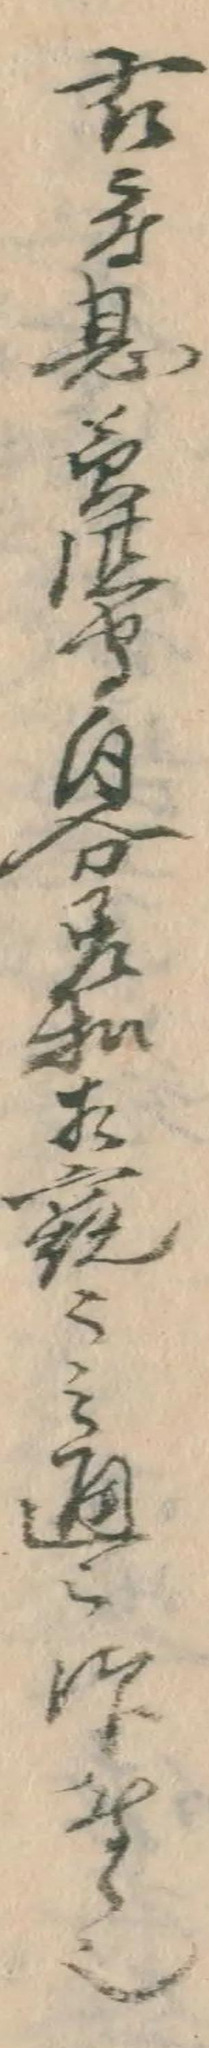右ニ付息美濃守自分差扣相窺々之通被仰付候也
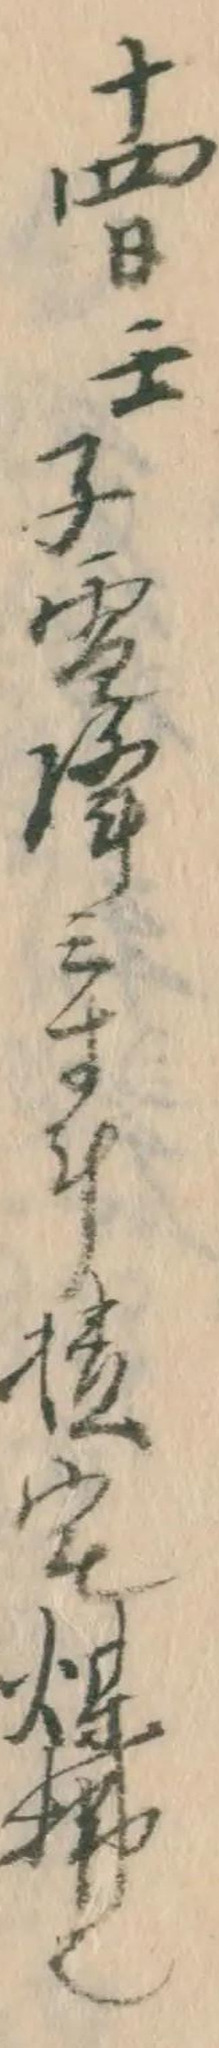十四日壬子雪降三寸斗積宅煤払也
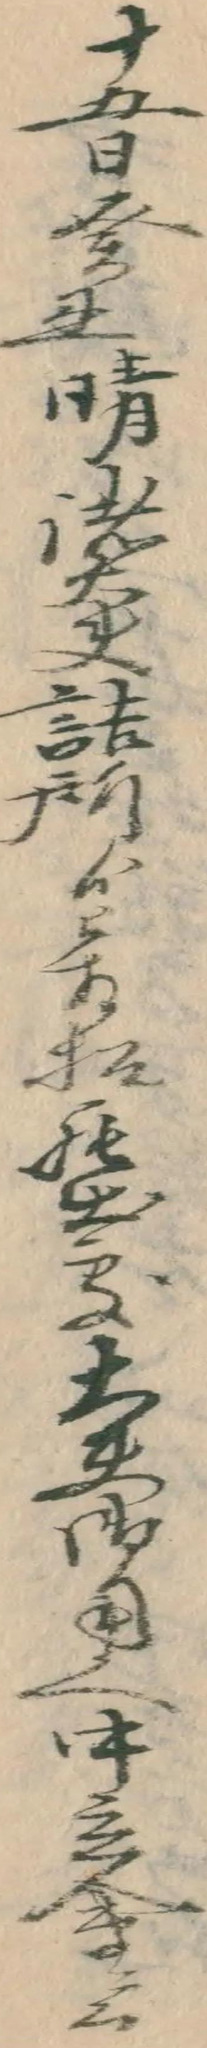十五日癸丑晴諸大夫詰所ゟ被有招罷出處大夫御用人中立會ニ而
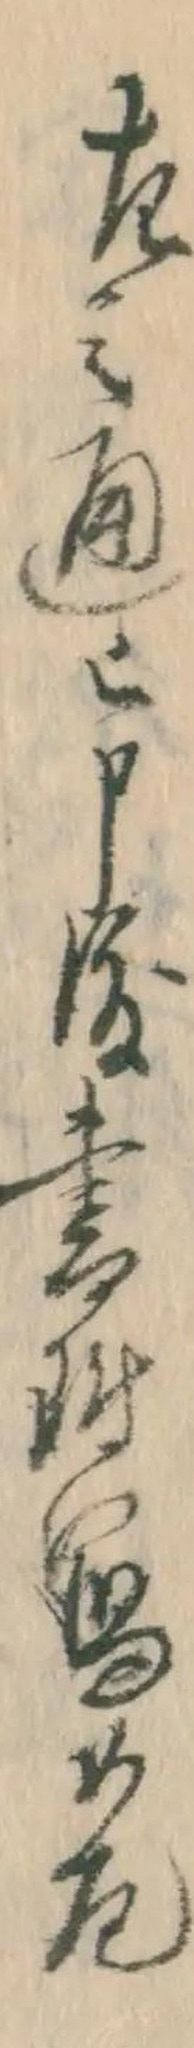左之通被申渡書附寫如左

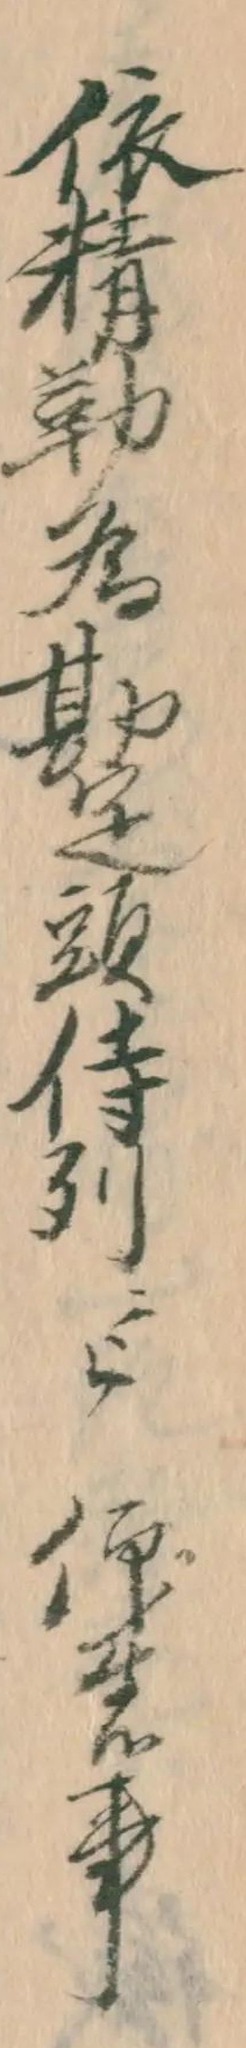一依精勤為勘定頭侍列ニ被仰付候事
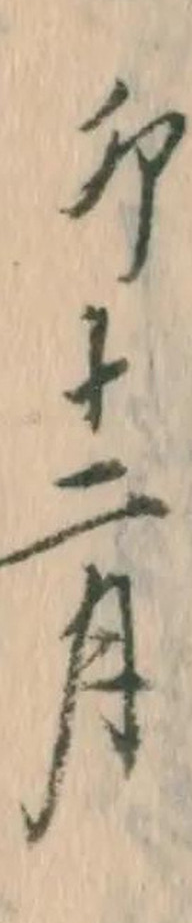卯十二月
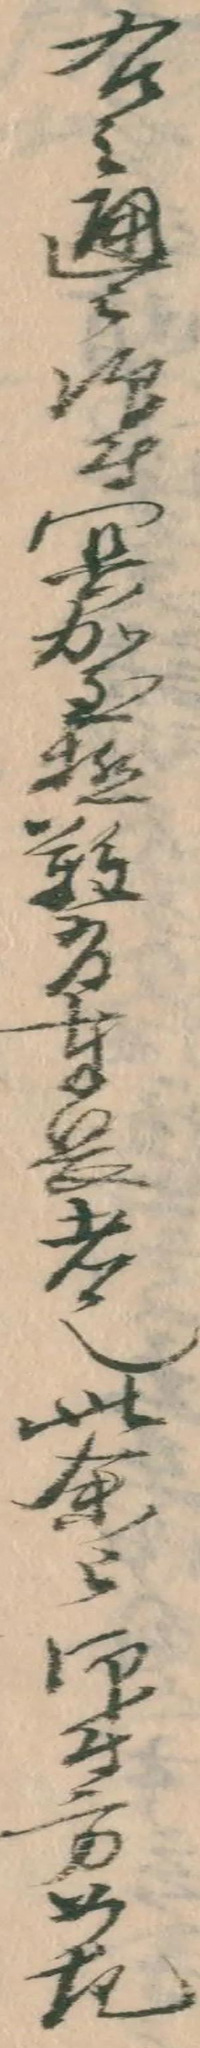右之通被仰付冥加至極難有奉畏者也此余被仰付方如左
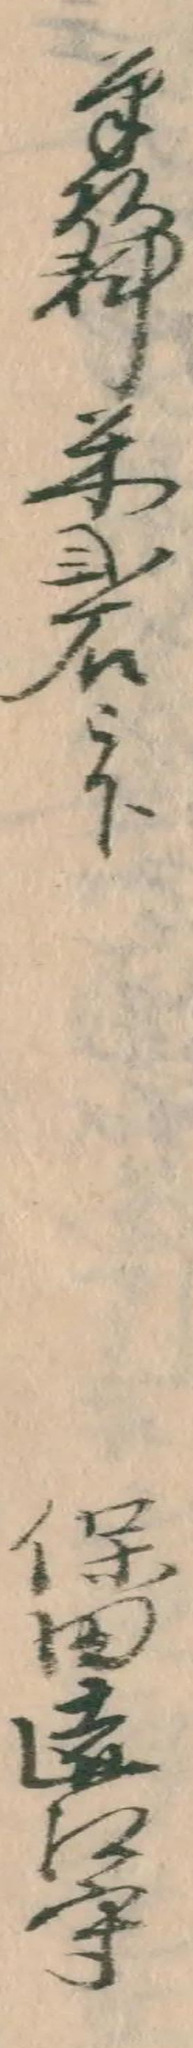筆頭料米弐石被下保田遠江守
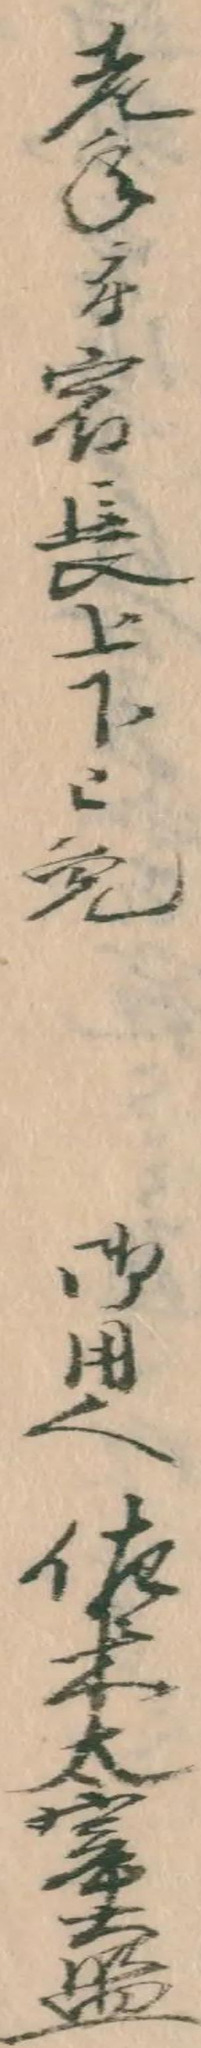老年ニ付宿長上下被免御用人佐々木太宰大監
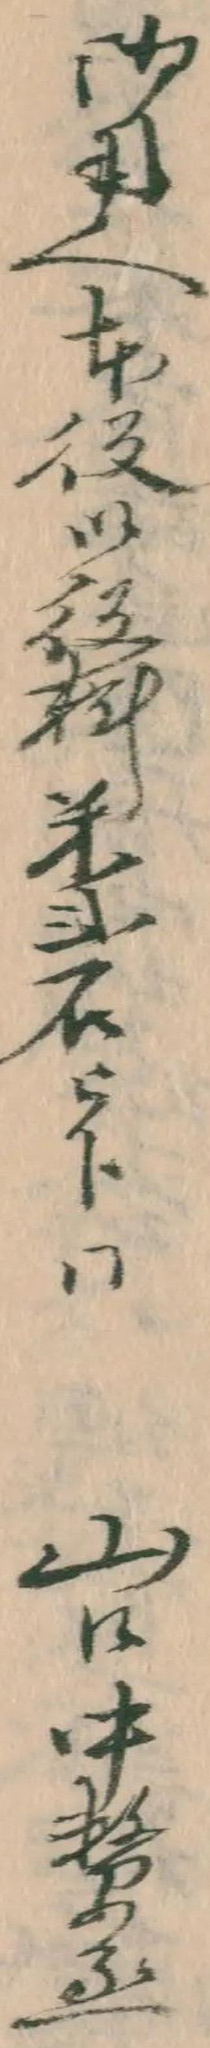御用人本役御役料米弐石被下同山口中務少丞
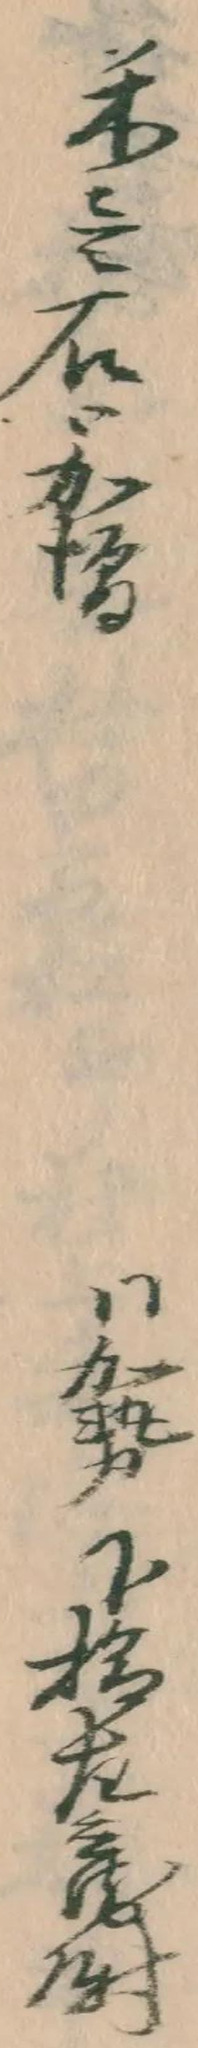米壱石御加増同加勢下橋左兵衛尉
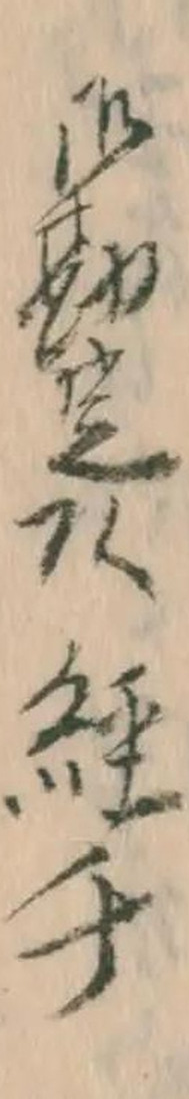御勘定頭経千
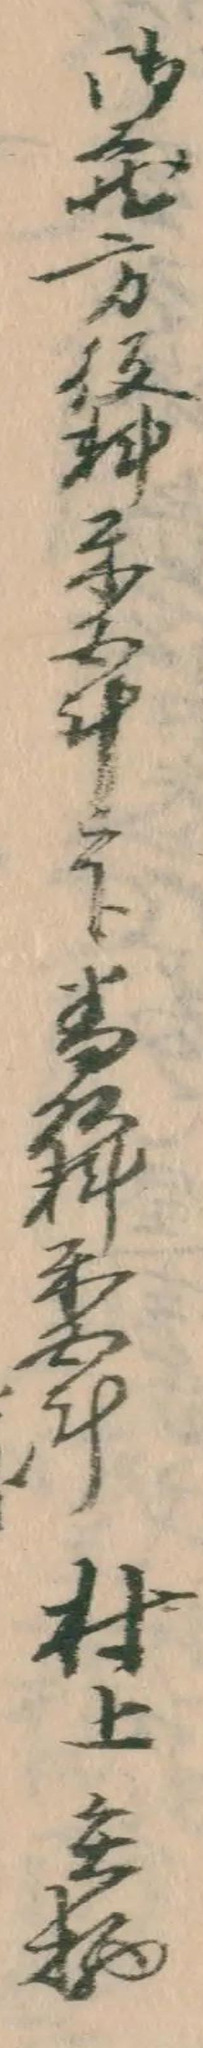御蔵方役料米五斗被下番頭料米五斗被下村上矢柄
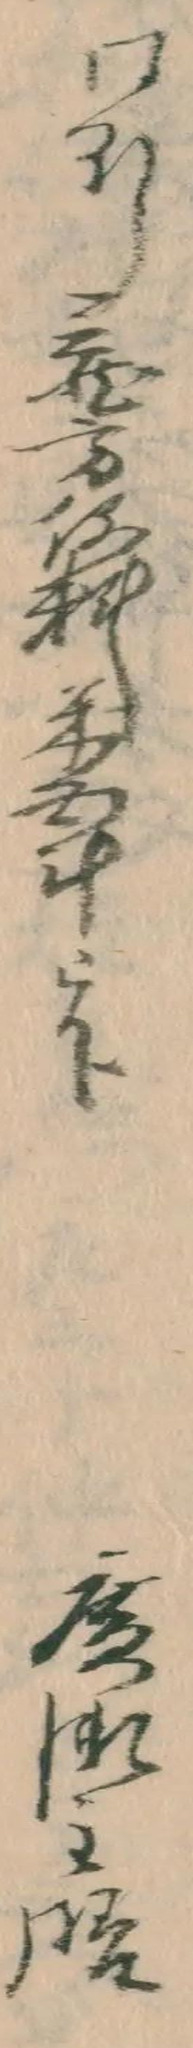同断御蔵方役料米五斗被下広瀬主膳
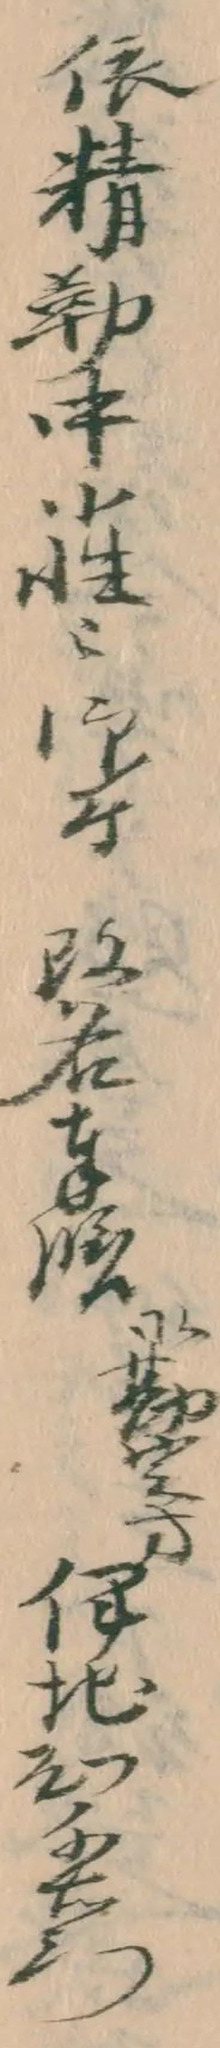依精勤中小性被仰付改名奉略御勘定方伊地知千右衛門
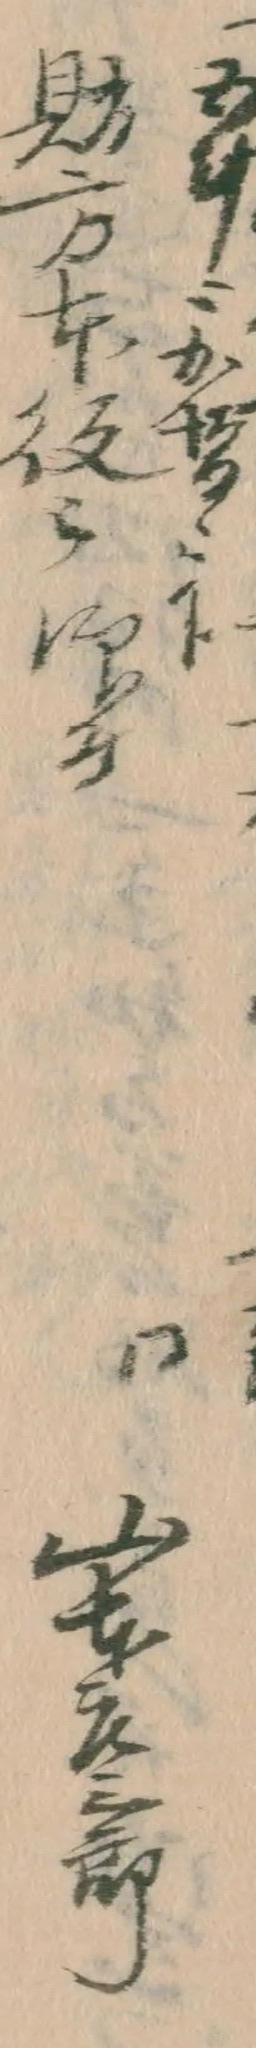賄方本役被仰付同山本庄三郎
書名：賀茂社記録. 第69冊
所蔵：国立国会図書館 National Diet Library, JAPAN
